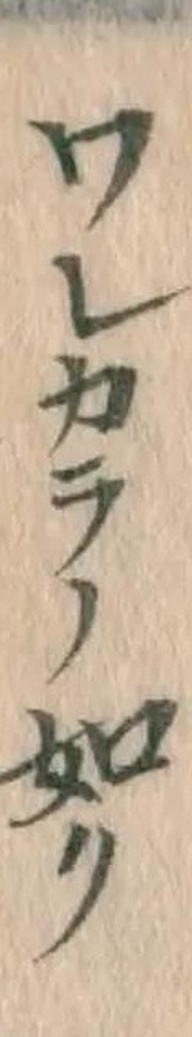ワレカラノ如ク
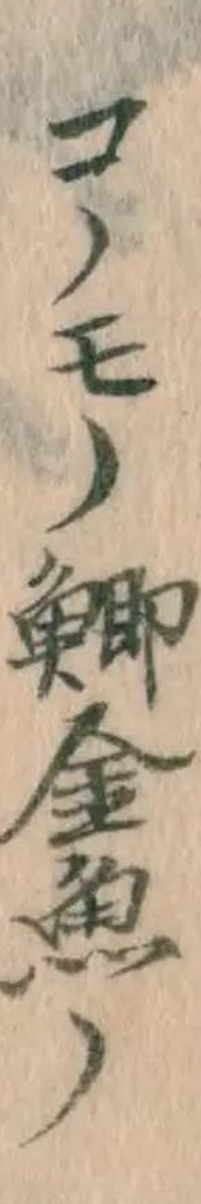コノモノ鲫金魚ノ
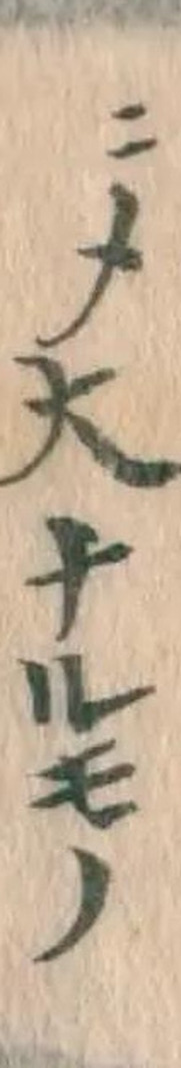ニシテ大ナルモノ
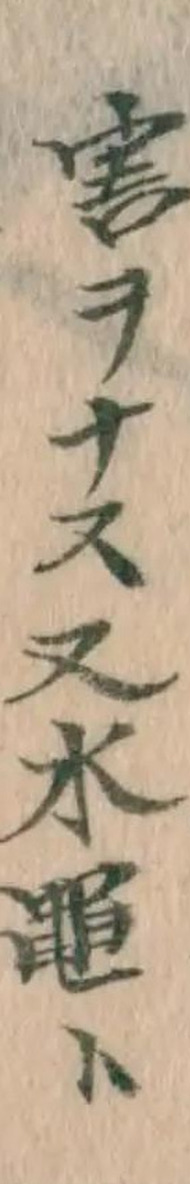害ヲナス又水黽ト
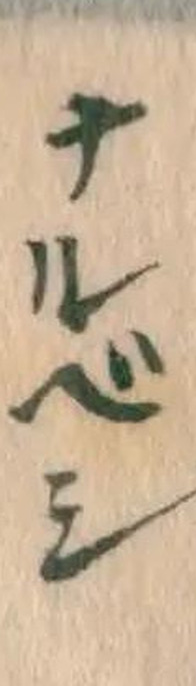ナルベシ
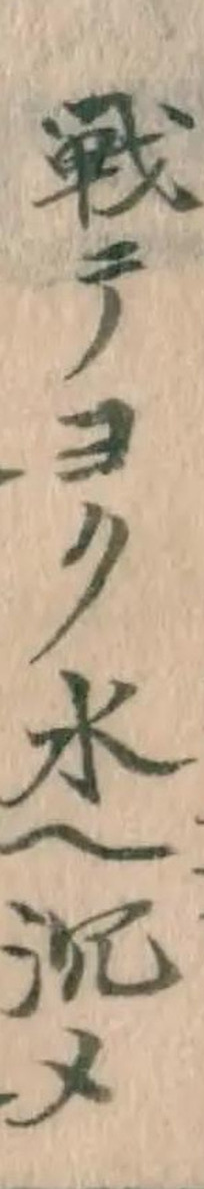戦テヨク水ヘ沉メ
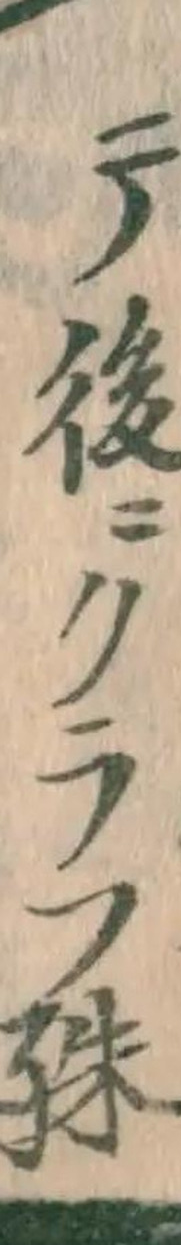テ後ニクラフ殊
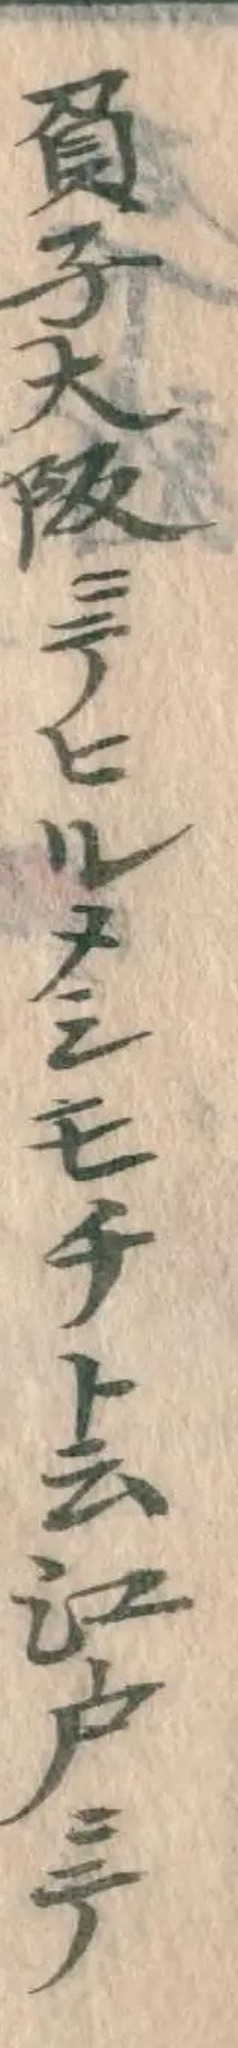負子大阪ニテヒルメシモチト云江戸ニテ
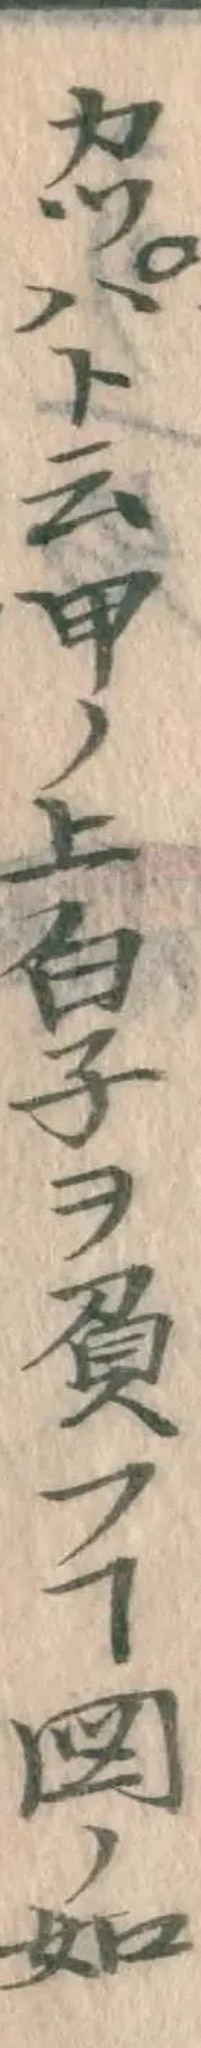カツパト云甲ノ上白子ヲ負フコト図ノ如
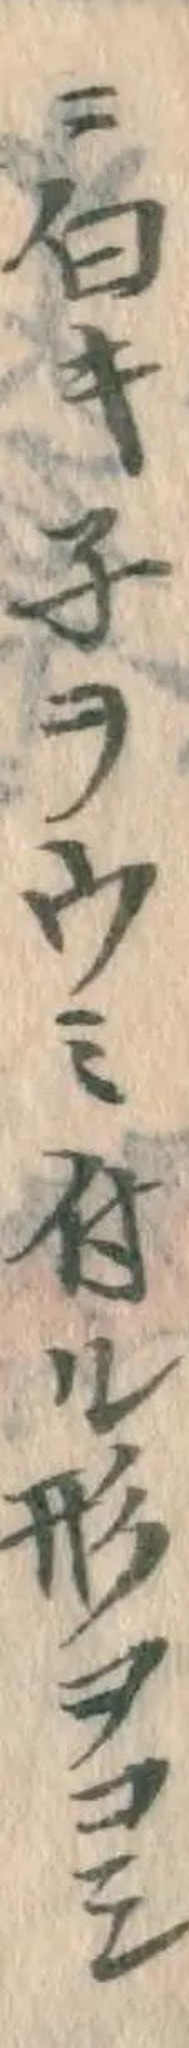ニ白キ子ヲウミ付ル形ヲコシ
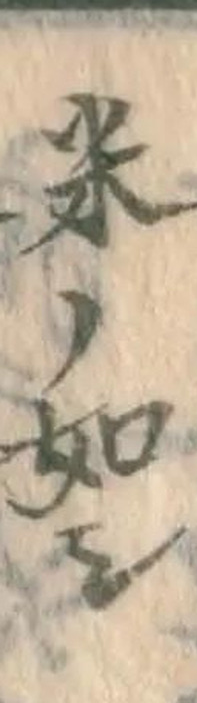米ノ如シ
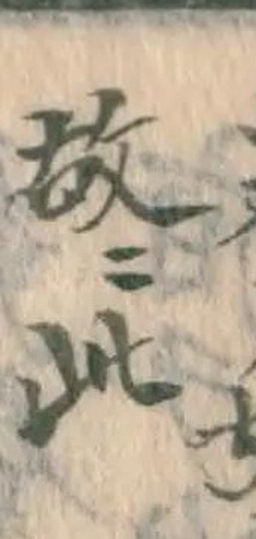故ニ此
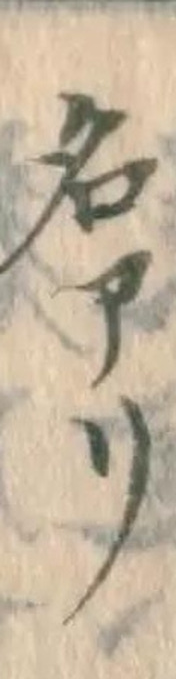名アリ
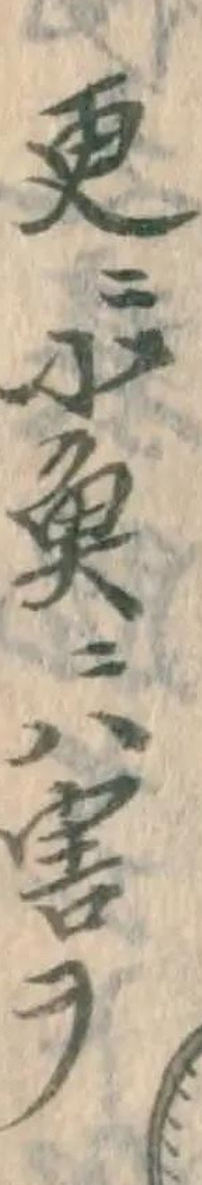更ニ小魚ニハ害ヲ
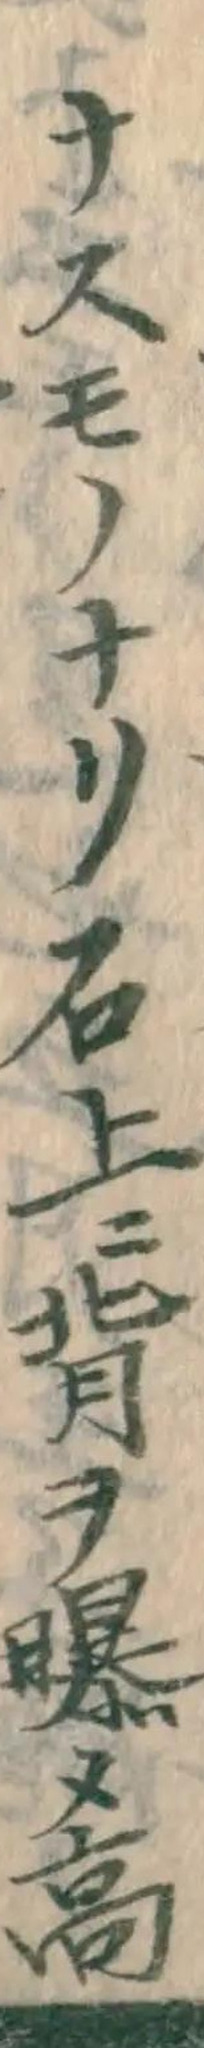ナスモノナリ石上ニ背ヲ曝シテ高
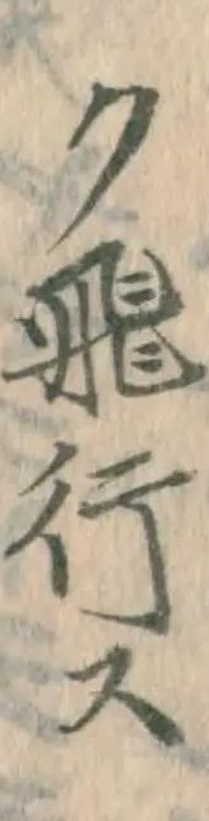ク飛行ス
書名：千蟲譜 3巻. [3]
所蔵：国立国会図書館 National Diet Library, JAPAN
